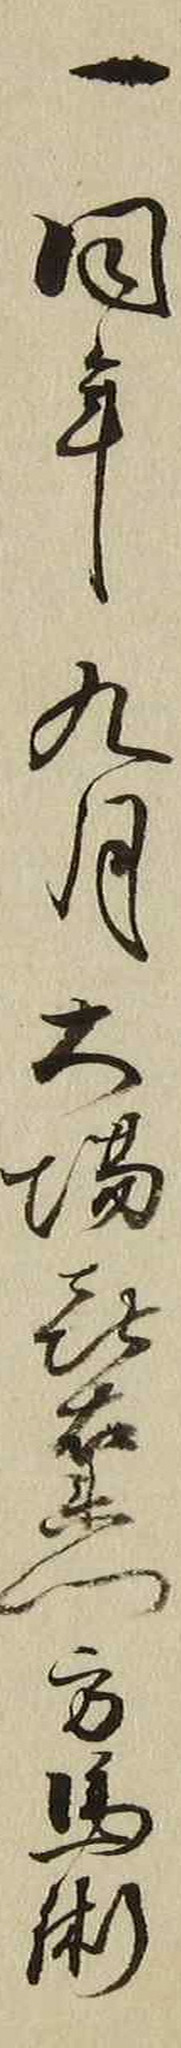一同年九月大場喜右衛門方馬術
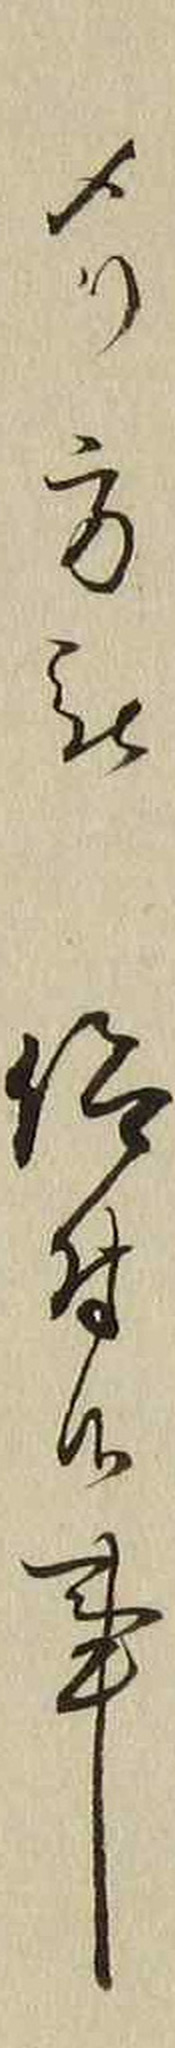〆り方被仰付候事
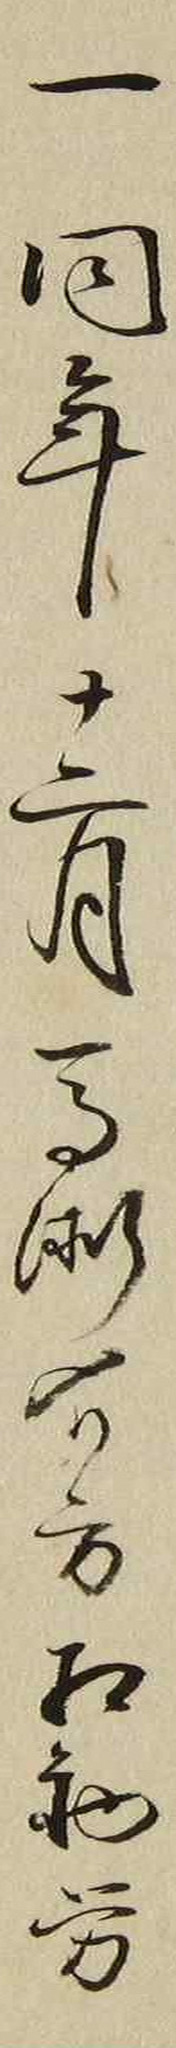一同年十二月馬術〆り方相勤労
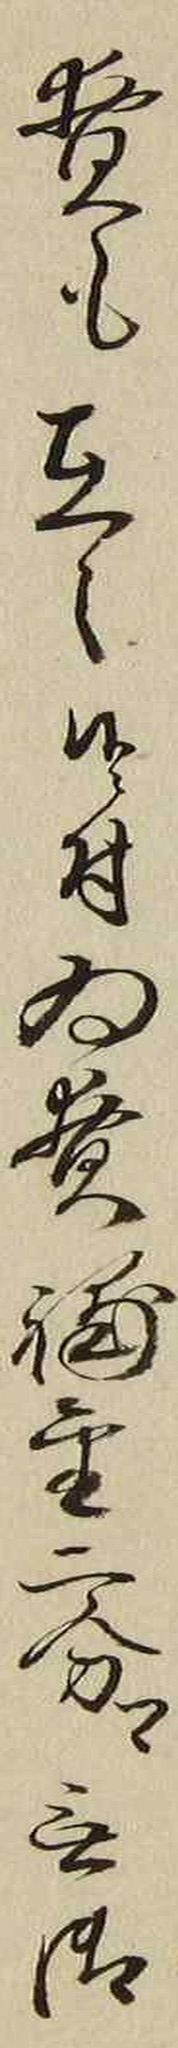費も在之候に付為費補金二分ツヽ無御
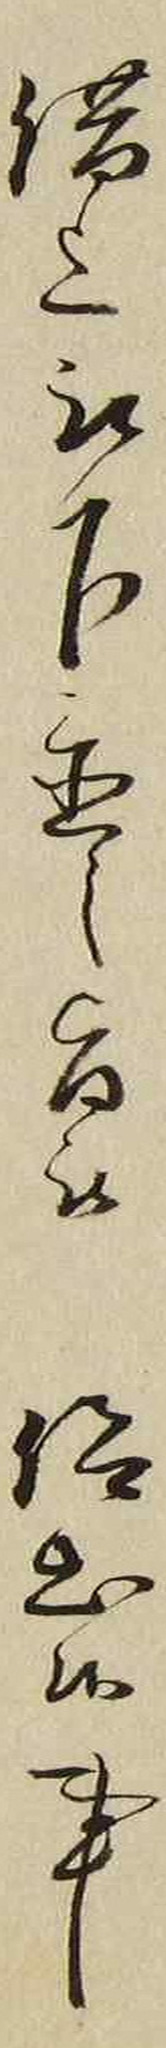借上被下置の旨被仰出候事
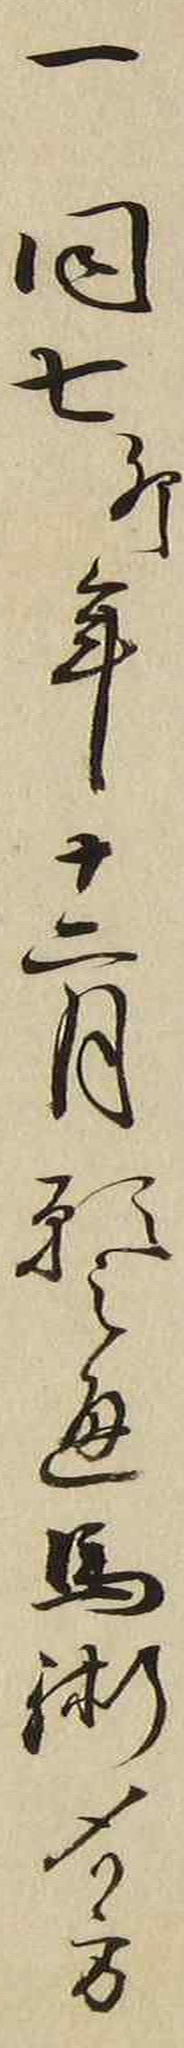一同七卯年十二月願の通馬術〆り方

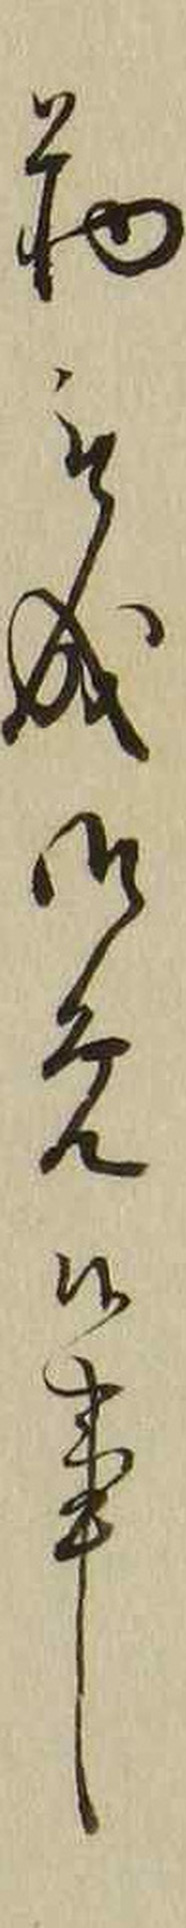勤被成御免候事
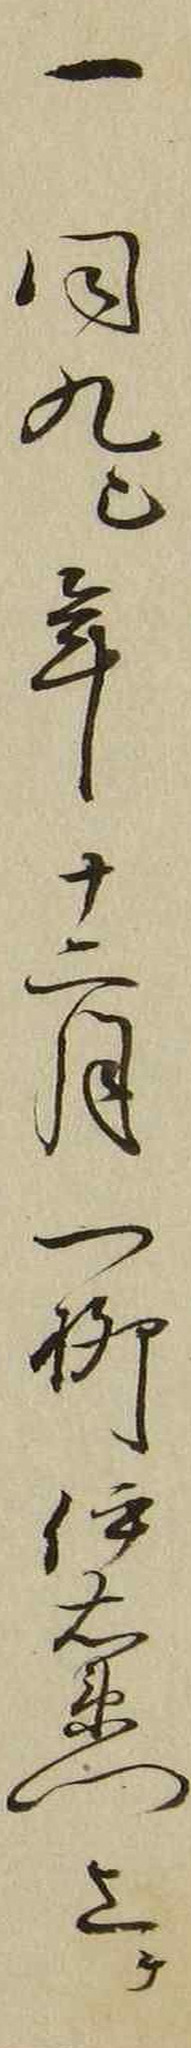一同九巳年十二月一柳伊右衛門上ケ
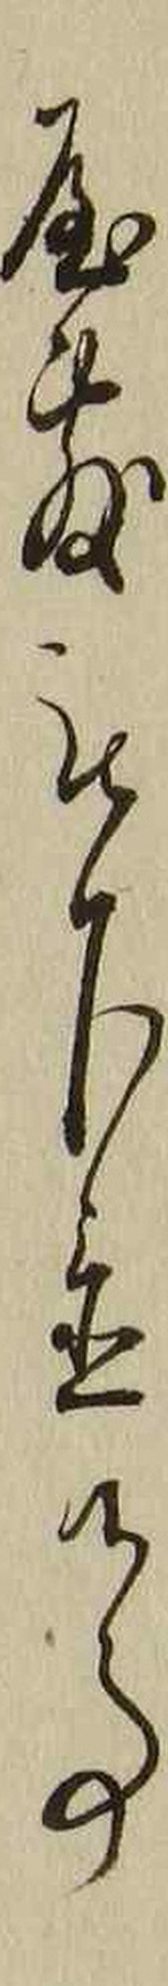屋敷被下置候事
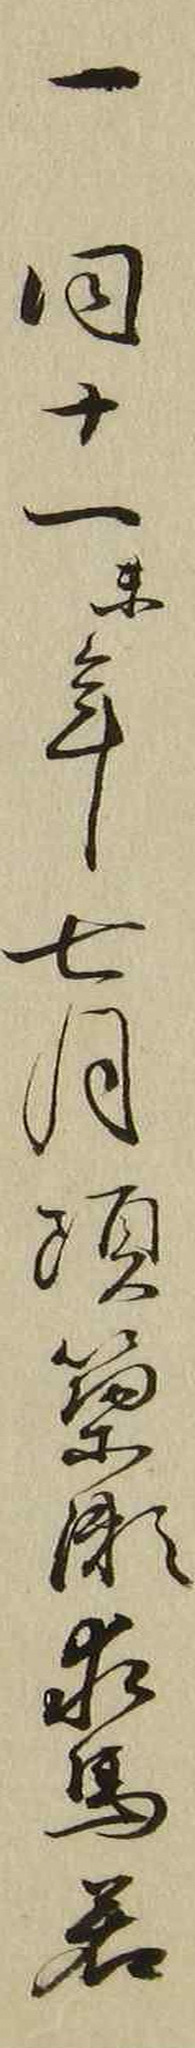一同十一未年七月頭簗瀬求馬若
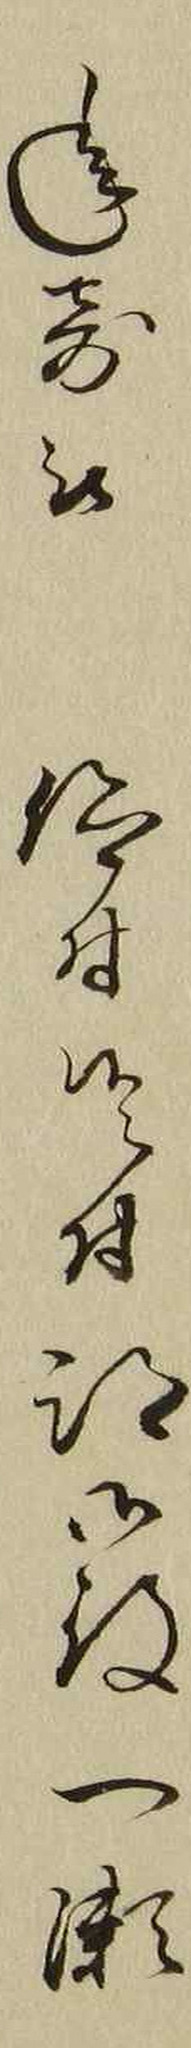年寄被仰付候に付跡御役一瀬
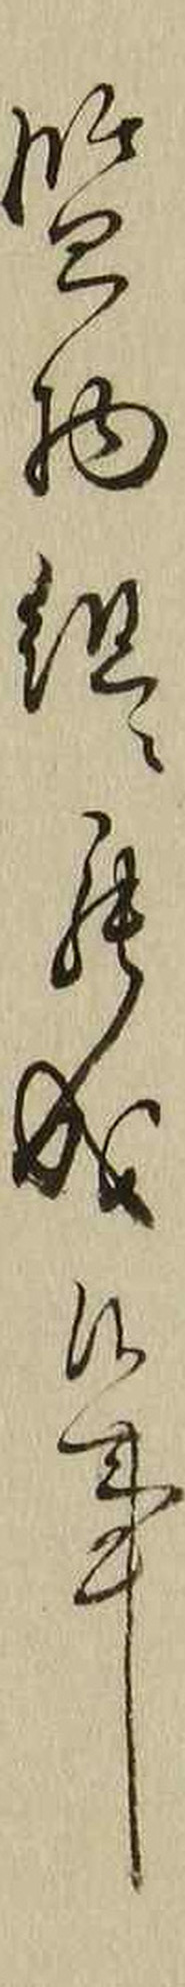監物組に罷成候事
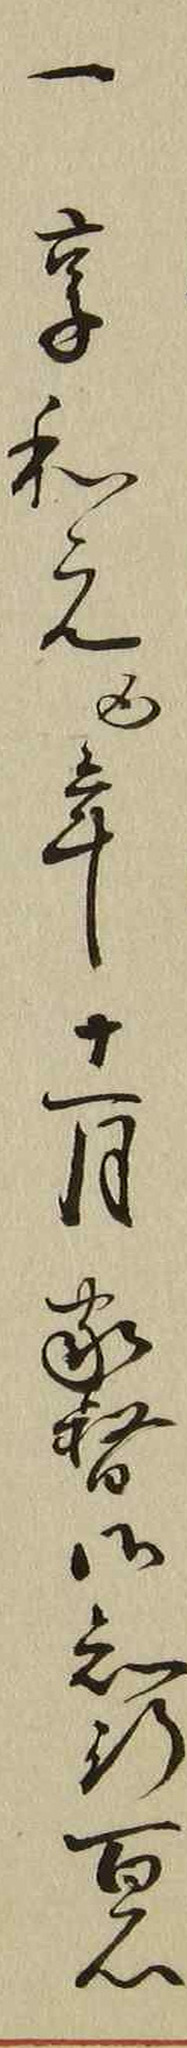一享和元酉年十一月家督御知行百石
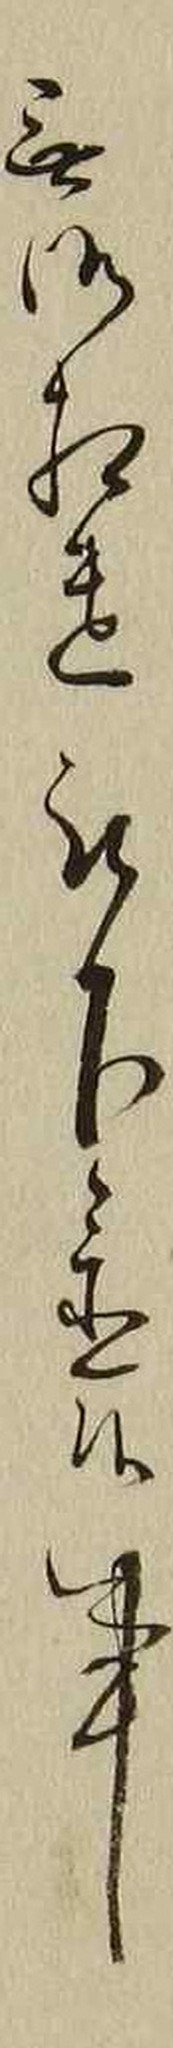無御相違被下置候事
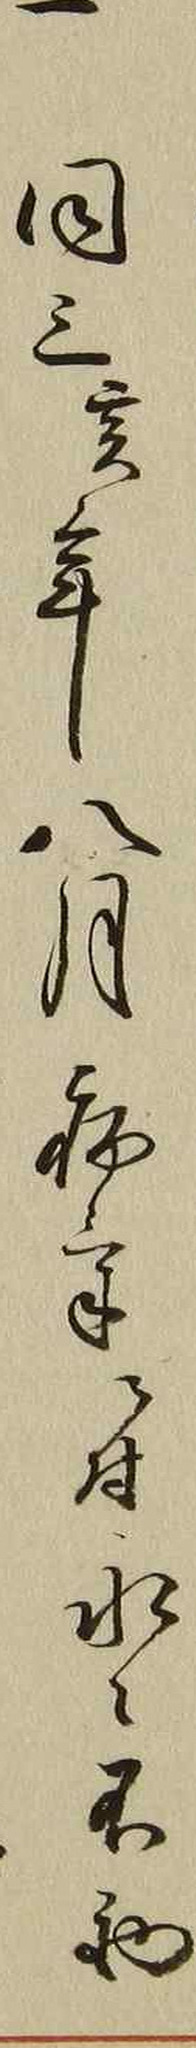一同三亥年八月病気に付永々不勤
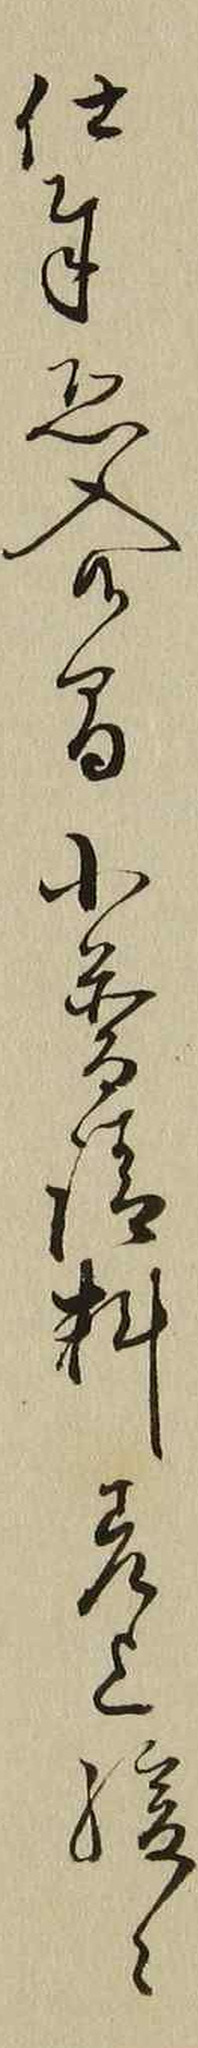仕奉恐入候間小普請料差上緩々
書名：諸士系譜　巻之1　い之部1
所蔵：会津若松市立会津図書館
